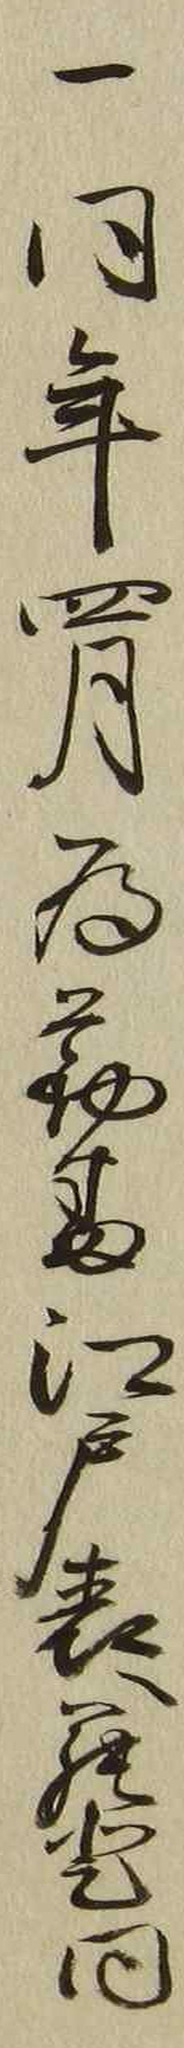一同年四月為勤番江戸表へ罷登同
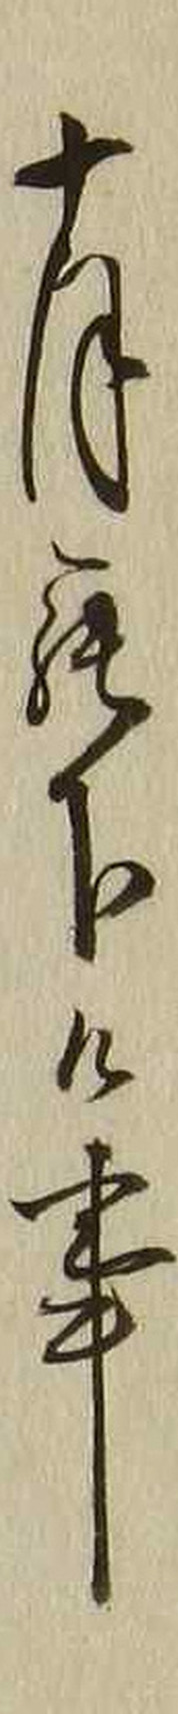十月罷下候事
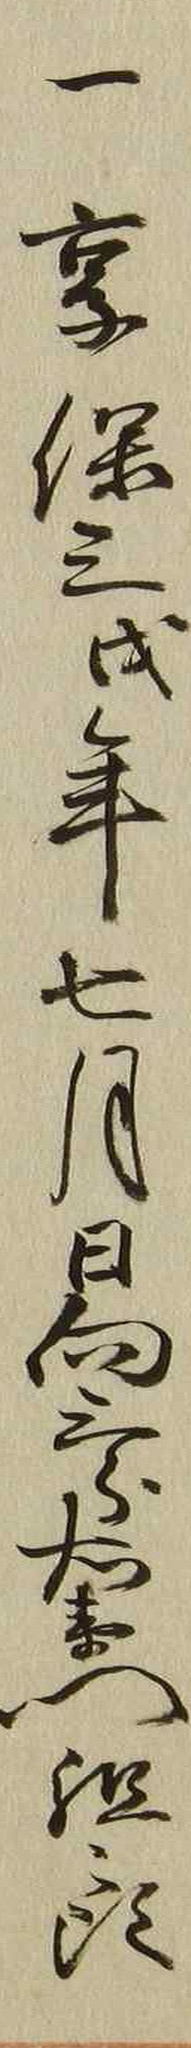一享保三戌年七月日向三郎右衛門組頭
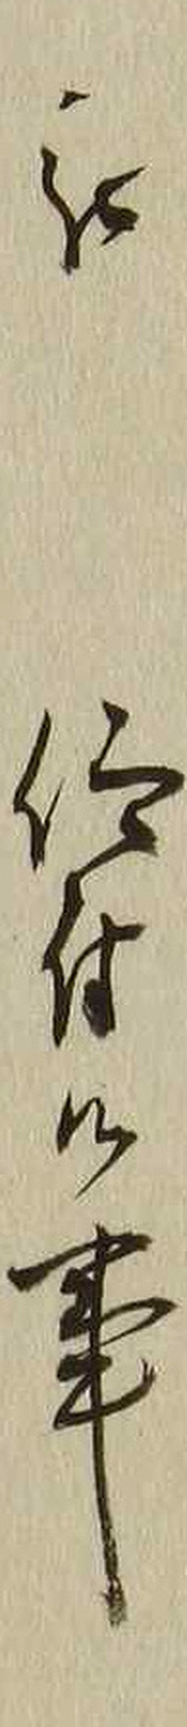被仰付候事
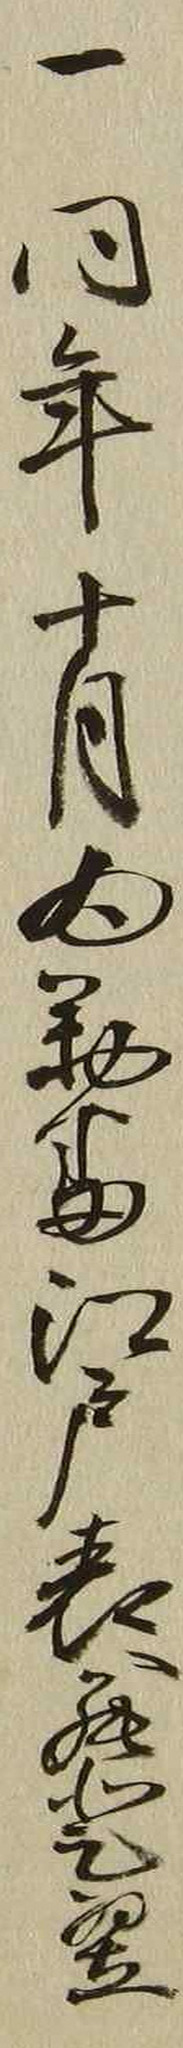一同年十月為勤番江戸表へ罷登翌
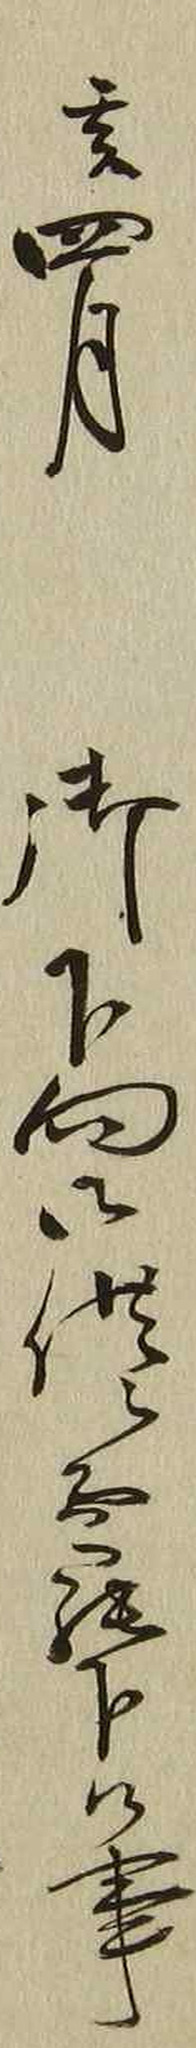亥四月御下向御供ニ而罷下候事
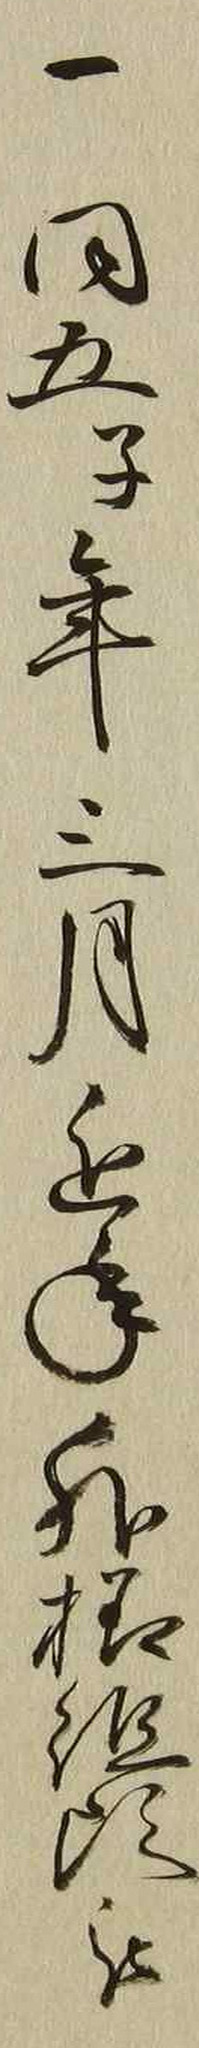一同五子年三月近年外様組頭被
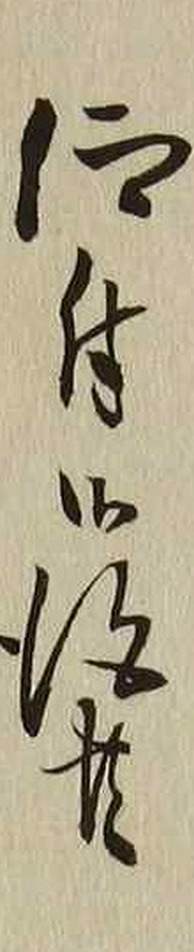仰付候得共
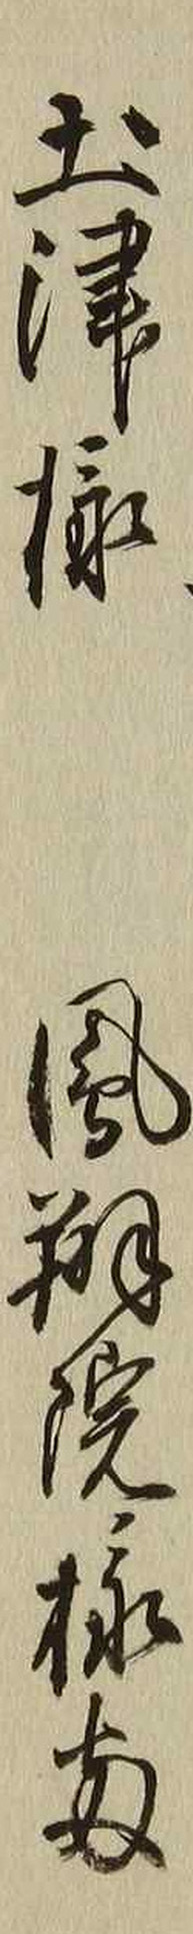土津様鳳翔院様両
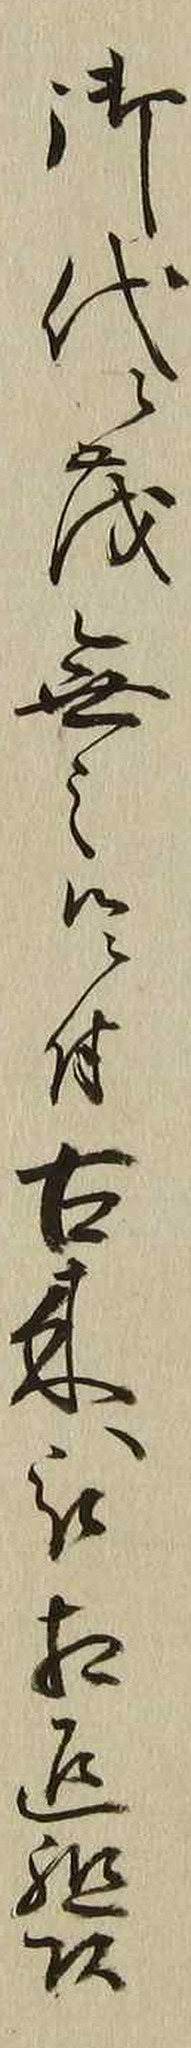御代ニも無之候ニ付古来へ相返組頭
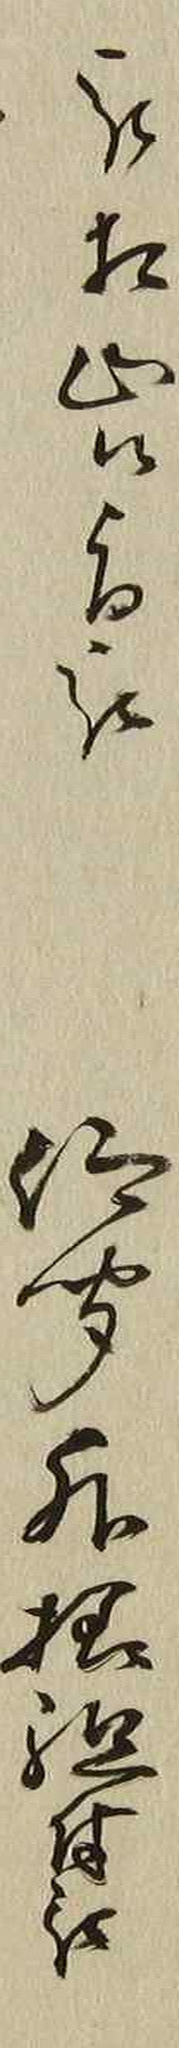被相止候旨被仰聞外様組付被
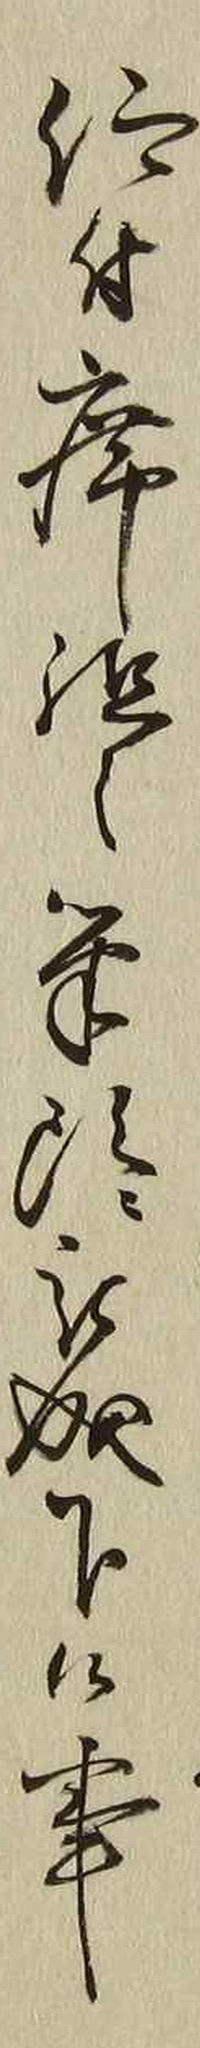仰付席組之筆頭ニ被成下候事
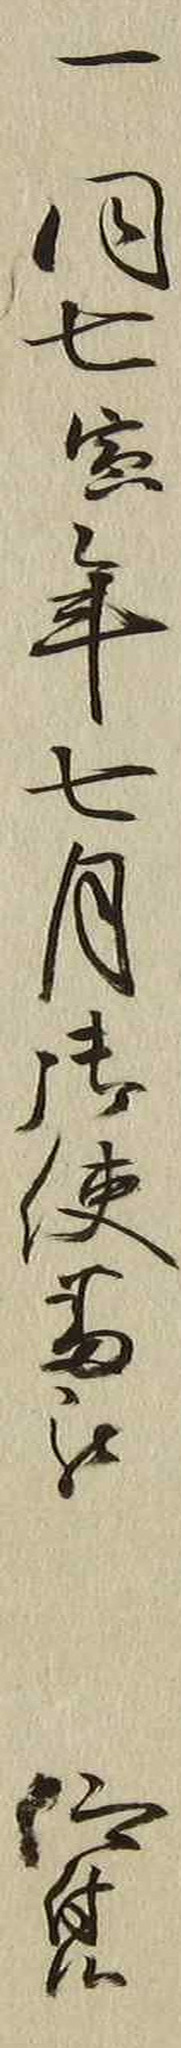一同七寅年七月御使番被仰付候
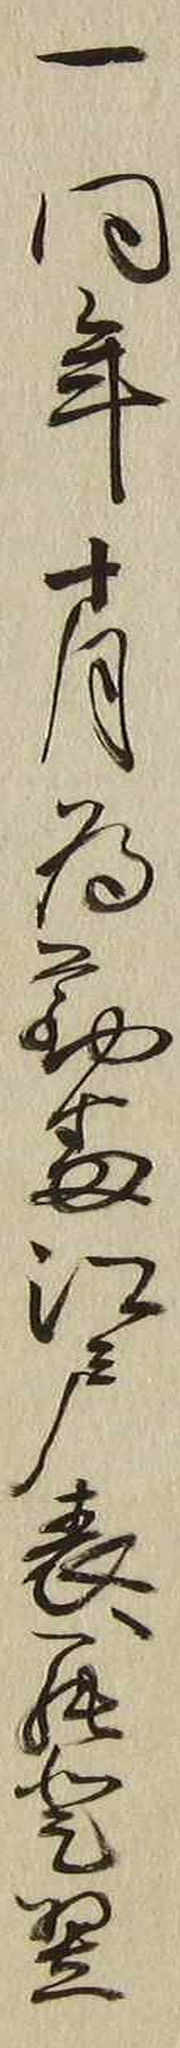一同年十月為勤番江戸表へ罷登翌
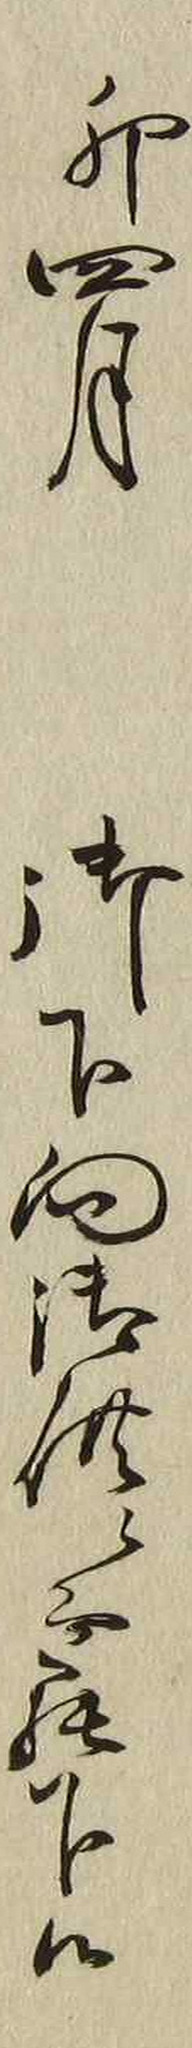卯四月御下向御供ニ而罷下候
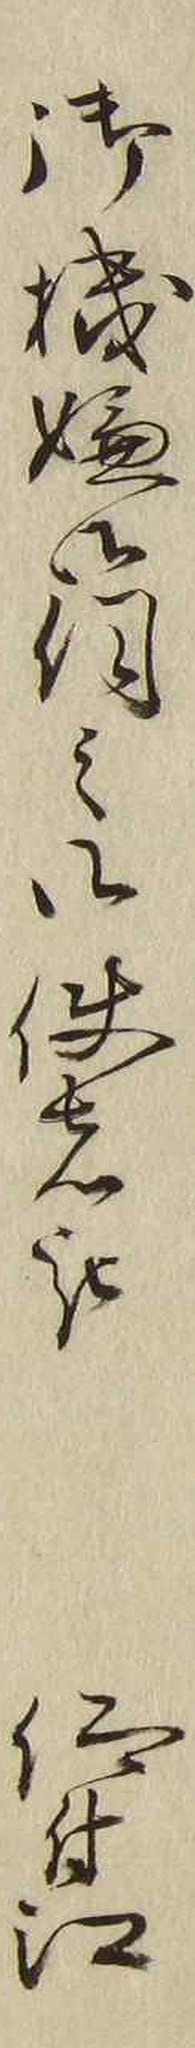御機嫌御伺之御使者被仰付江
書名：諸士系譜　巻之60　と之部3
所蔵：会津若松市立会津図書館
